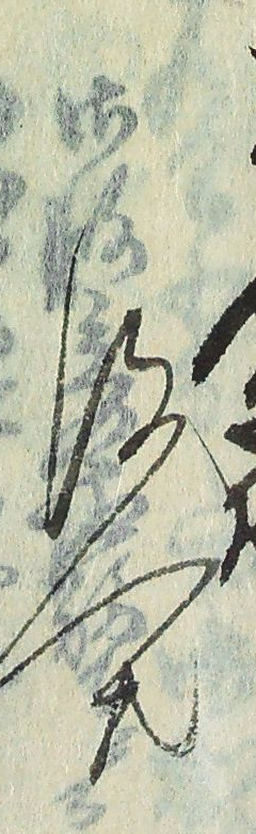役人共

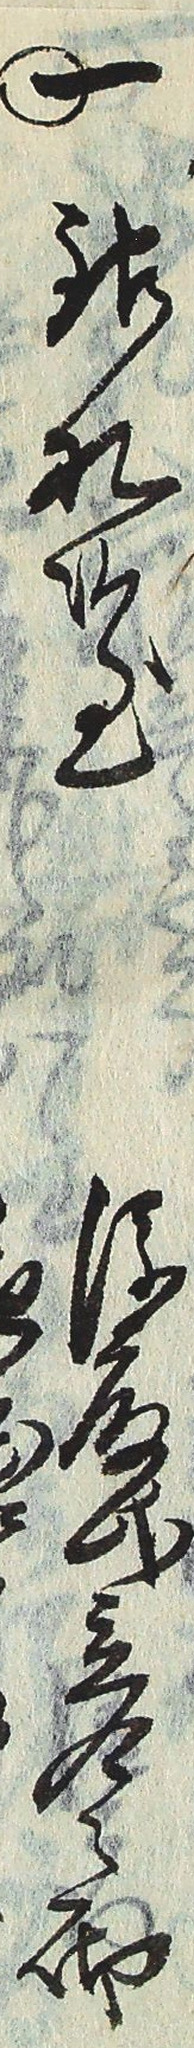一銀札弐匁後藤氏立合之砌
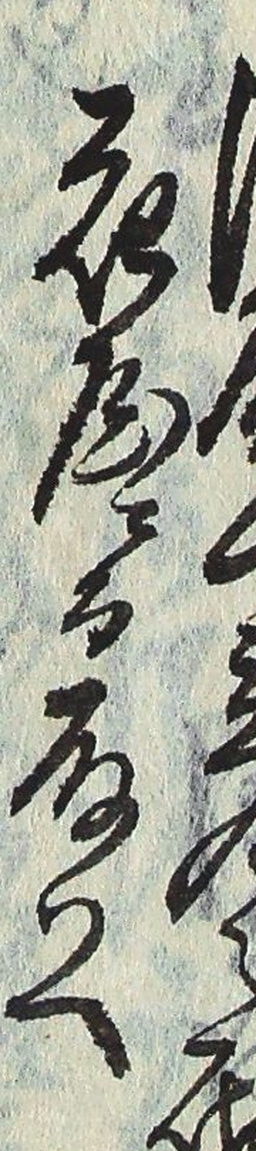花屋にて取かへ
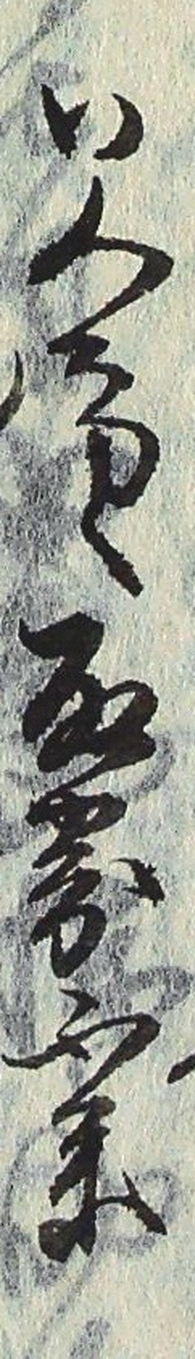八人分へ取寄不参
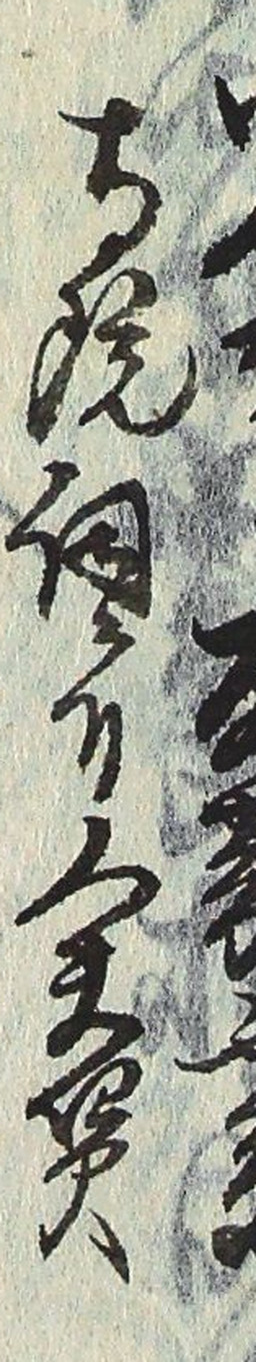寺院伺に付人夫賃
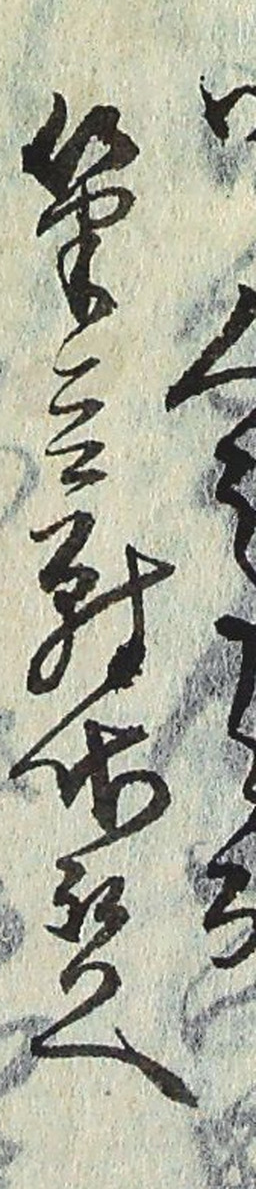筆壱対代取かへ
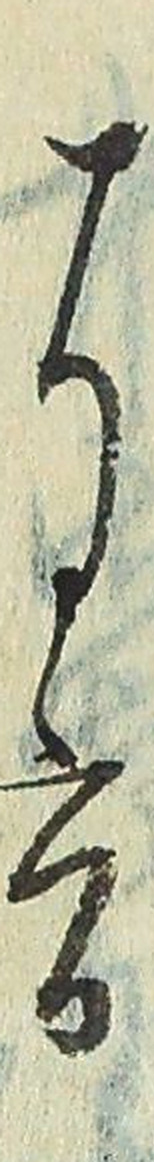十月六日
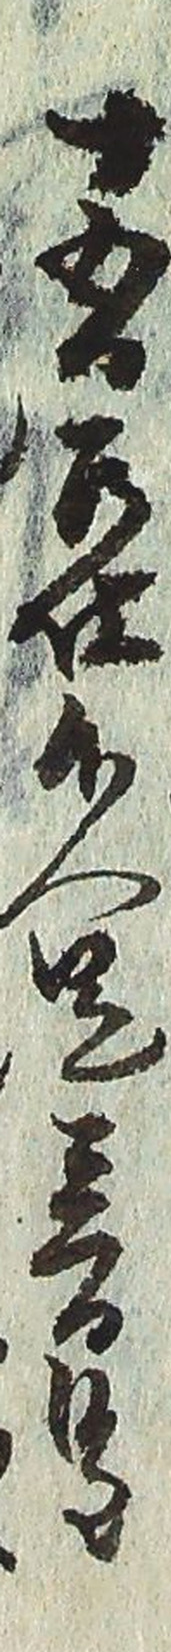十五日召仕候人足壱日弐匁
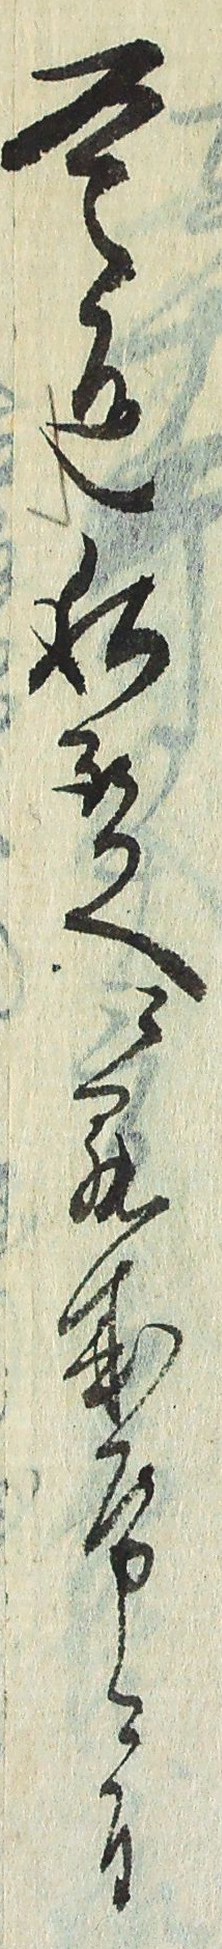右之通私取かへに罷成居申に付
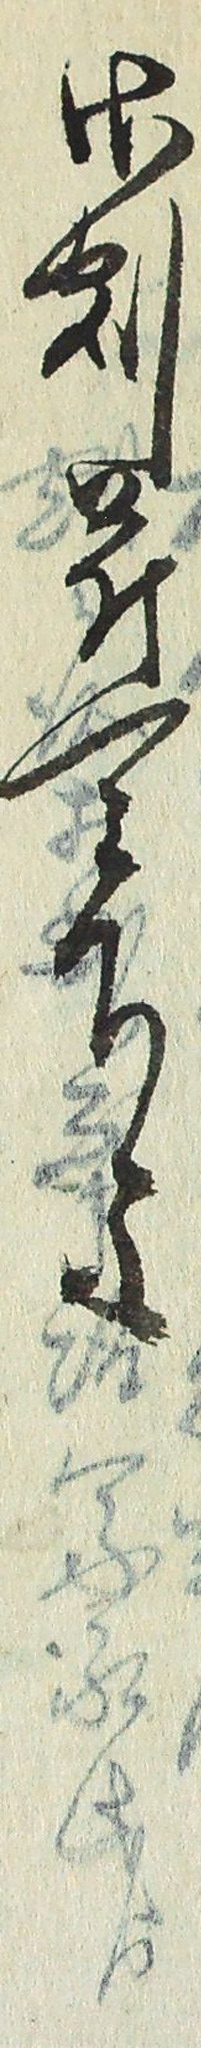御割苻可被下候以上
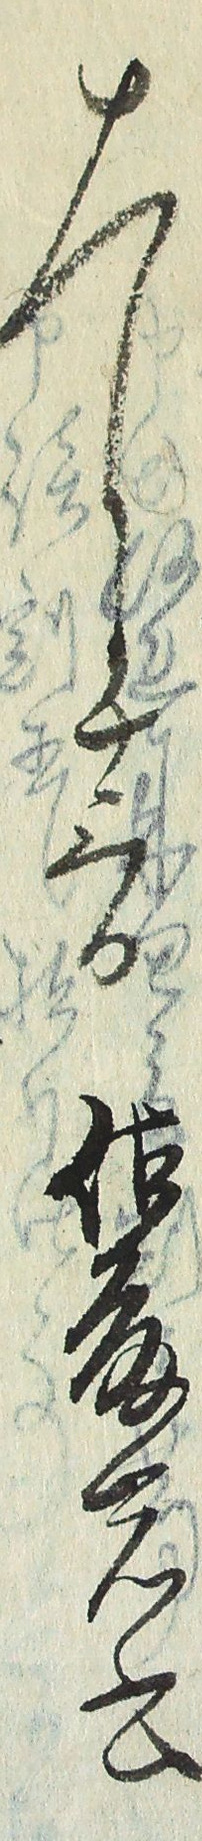十一月十三日佐藤岩六
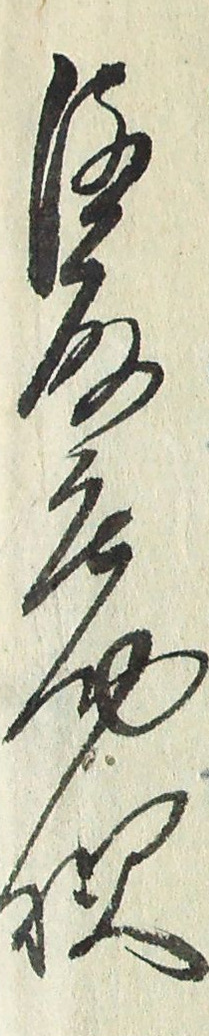後藤庄助様

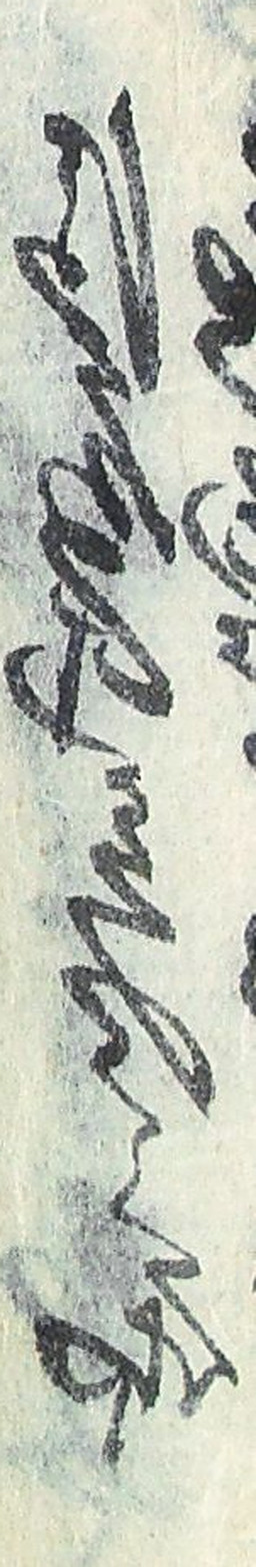子十一月十三日
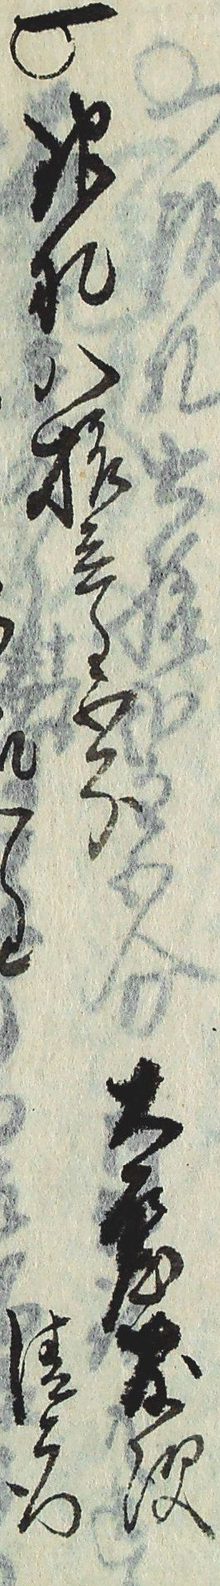一銀札八拾壱匁五分大石屋友次
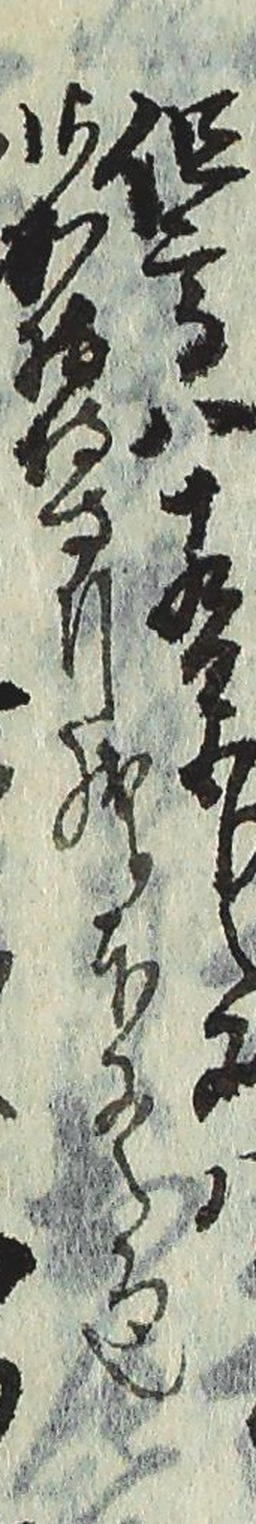御加扶持方引残り本文之通
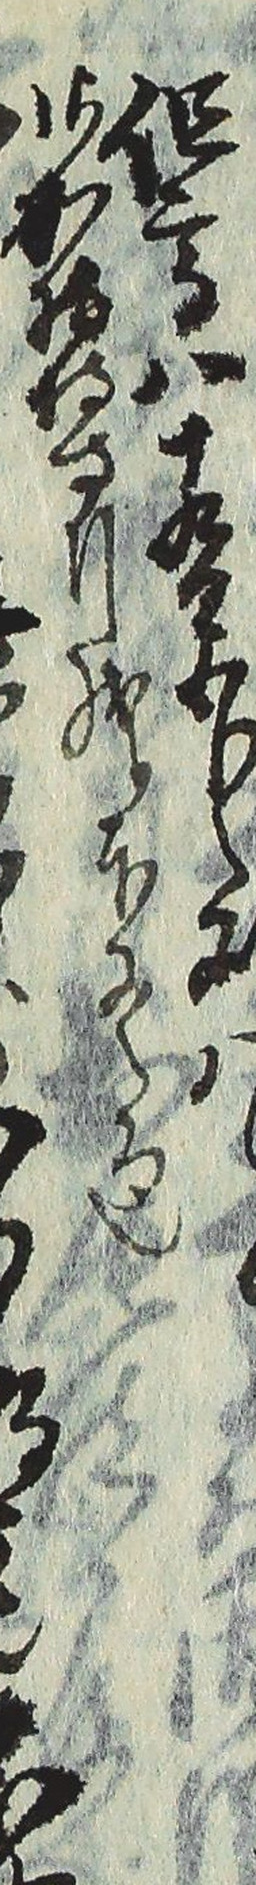御加扶持方引残り本文之通
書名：名東郡中諸割賦元帳
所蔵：鳴門教育大学 Naruto University of Education
